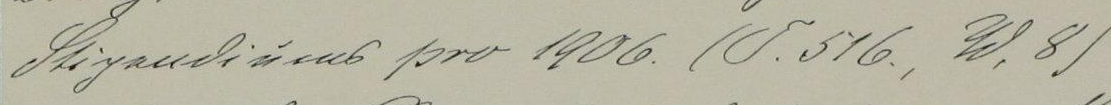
Stipendiums pro 1906. (T.516., W.8)
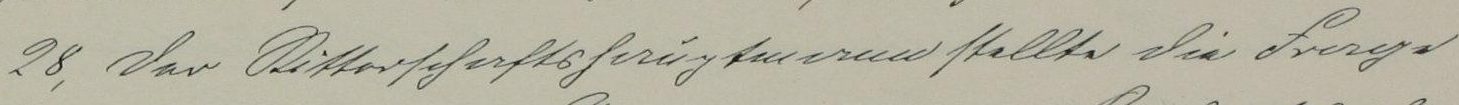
28. Der Ritterschaftshauptmann stellte die Frage
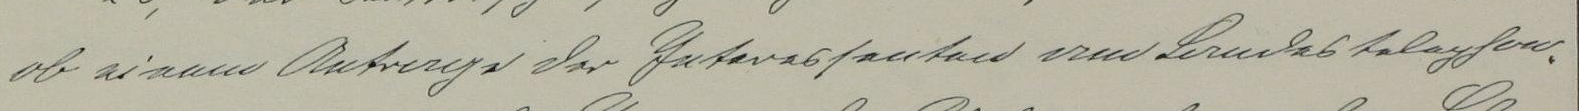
ob einem Antrage der Interessenten am Landestelephon-
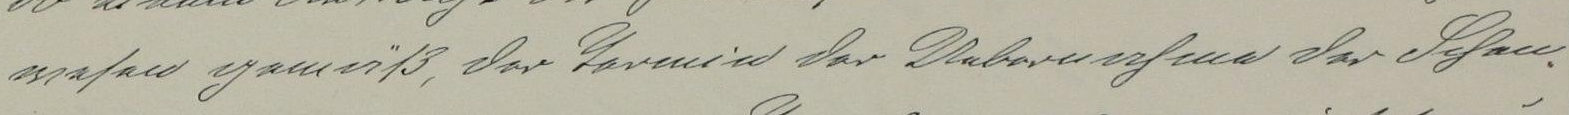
wesen gemäß, der Termin der Uebernahme der Schen-
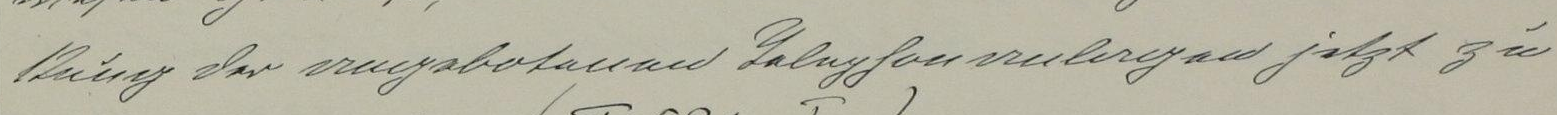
kung der angebotenen Telephonanlagen jetzt zu
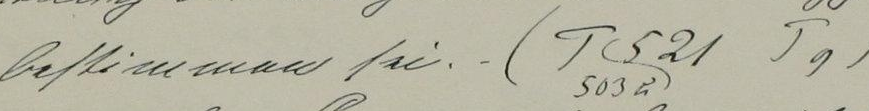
bestimmen sei. (T521 T9)
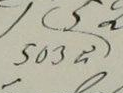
503 u
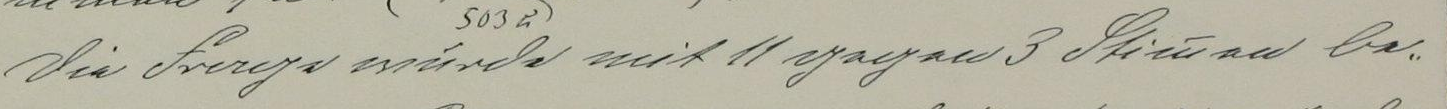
Die Frage wurde mit 11 gegen 3 Stimmen be-
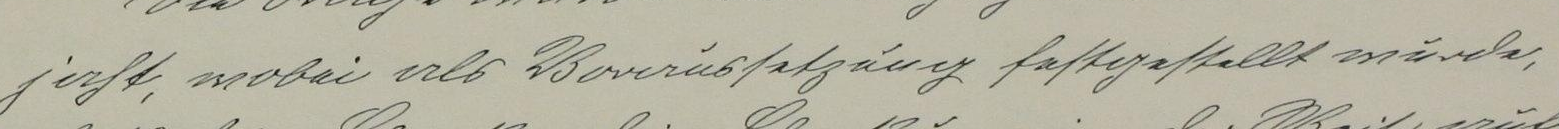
jaht, wobei als Voraussetzung festgestellt wurde,
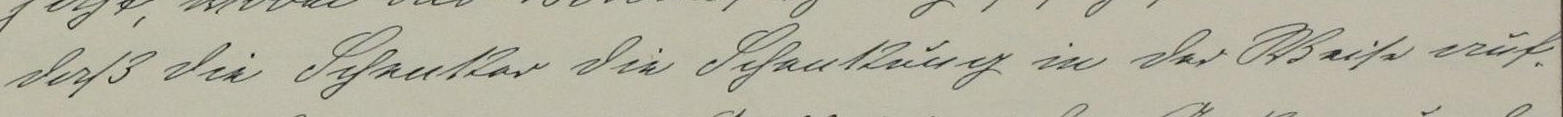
daß die Schenker die Schenkung in der Weise auf-
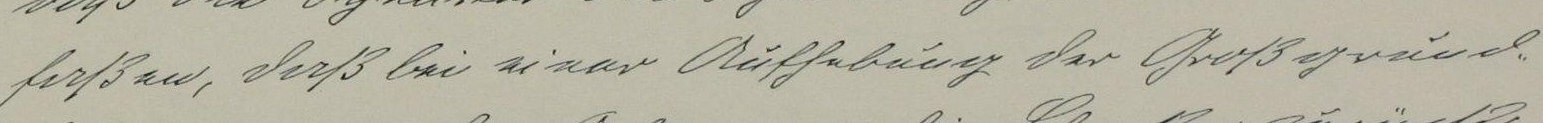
faßen, daß bei einer Aufhebung der Großgrund-
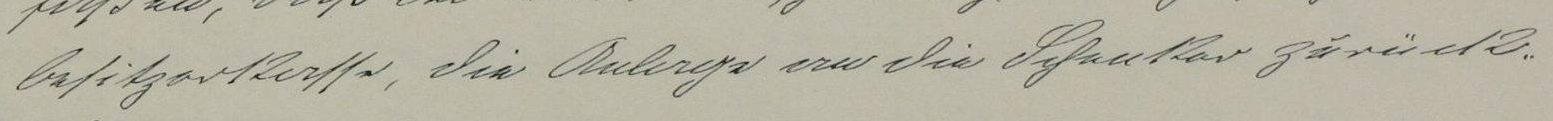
besitzerkasse, die Anlage an die Schenker zurück-
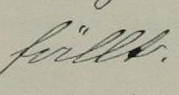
fällt.
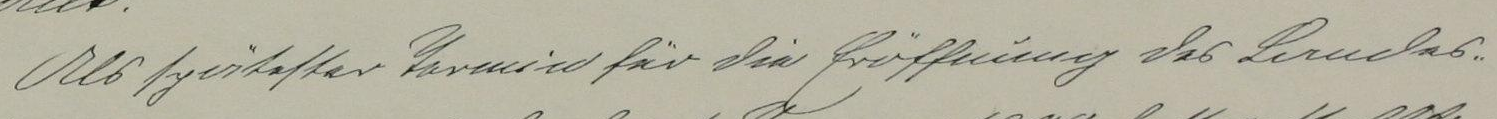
Als spätester Termin für die Eröffnung des Landes-
